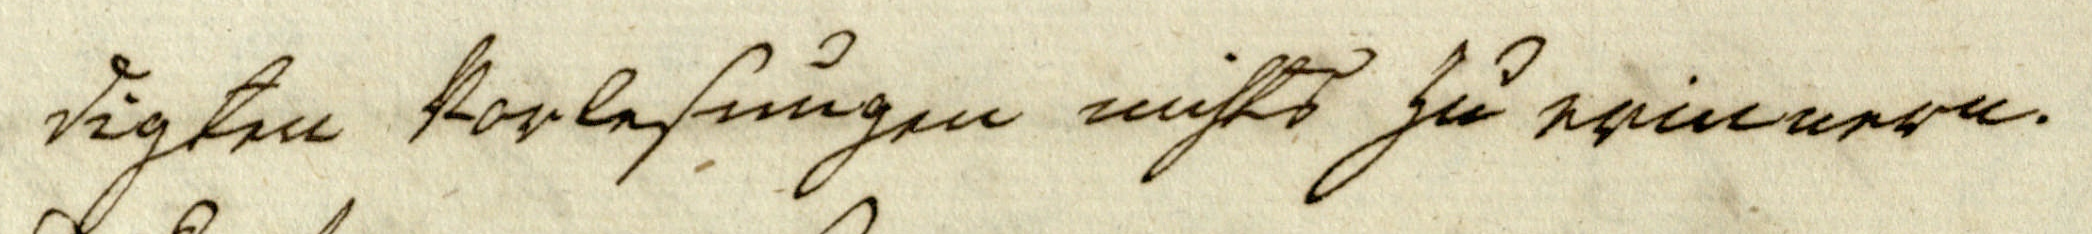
digten Vorlesungen nichts zu erinnern.
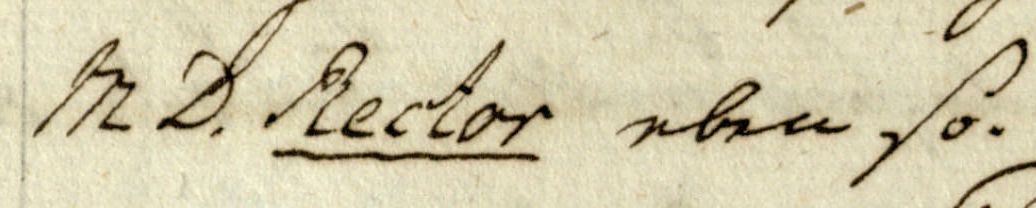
M. D. Rector eben so.
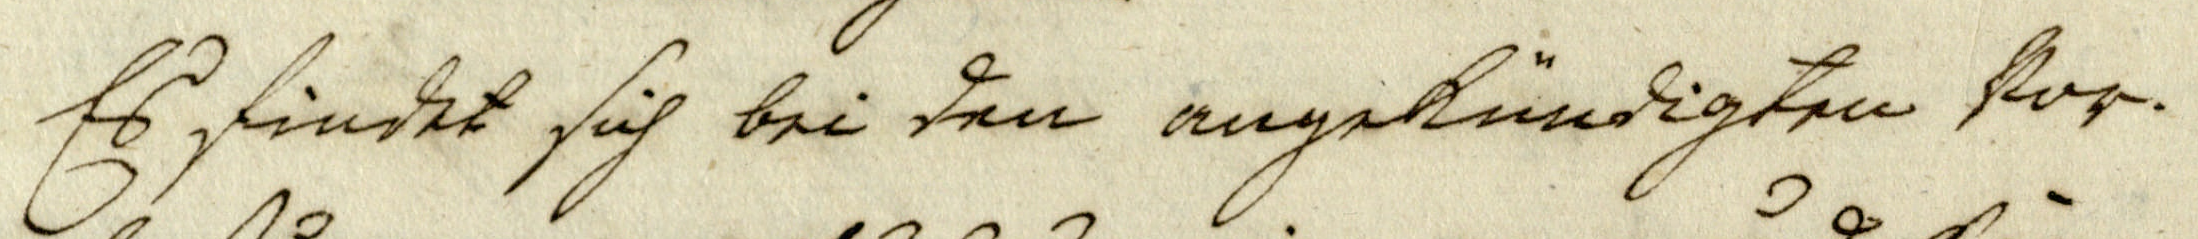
Es findet sich bei den angekündigten Vor¬
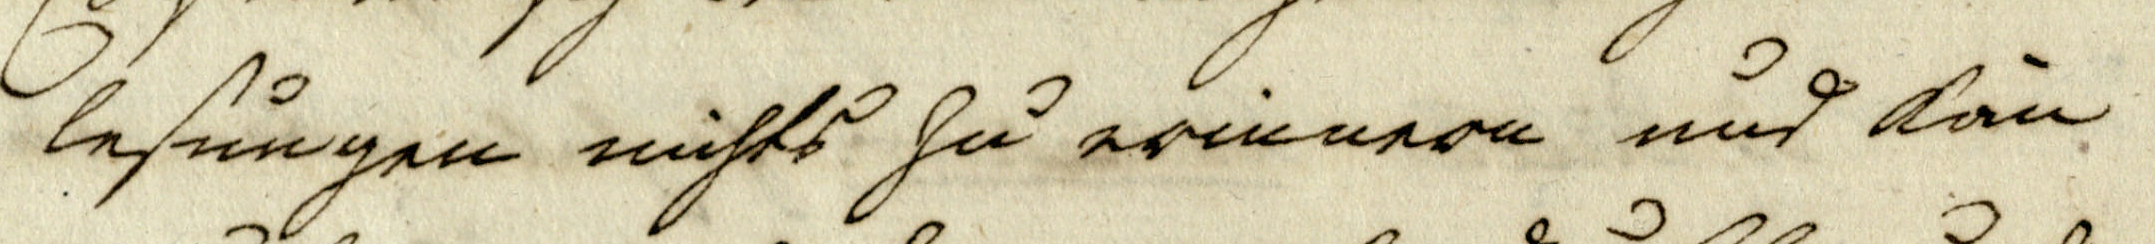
lesungen nichts zu erinnern und kan
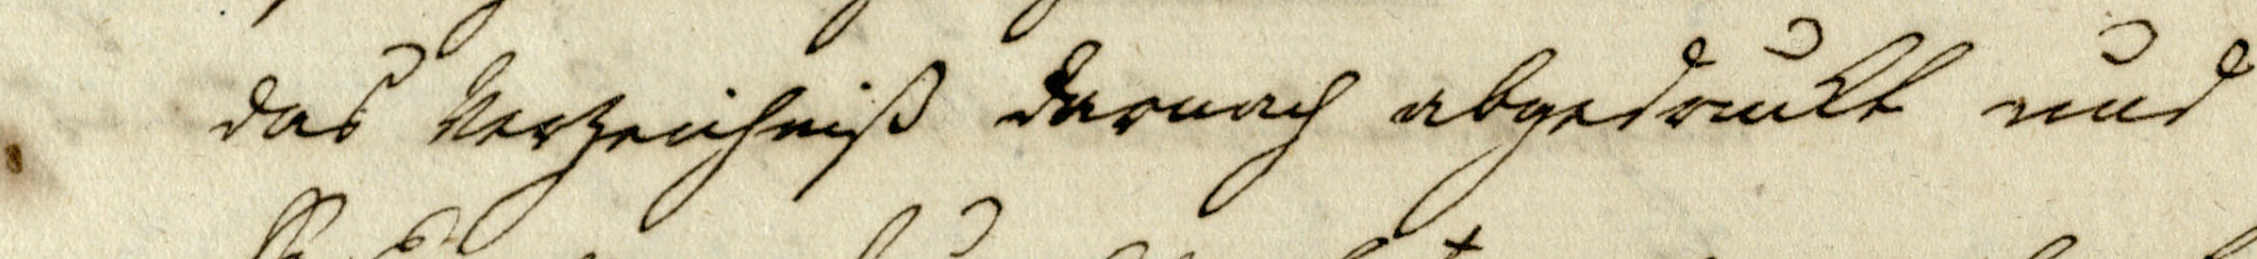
das Verzeichniß darnach abgedruckt und
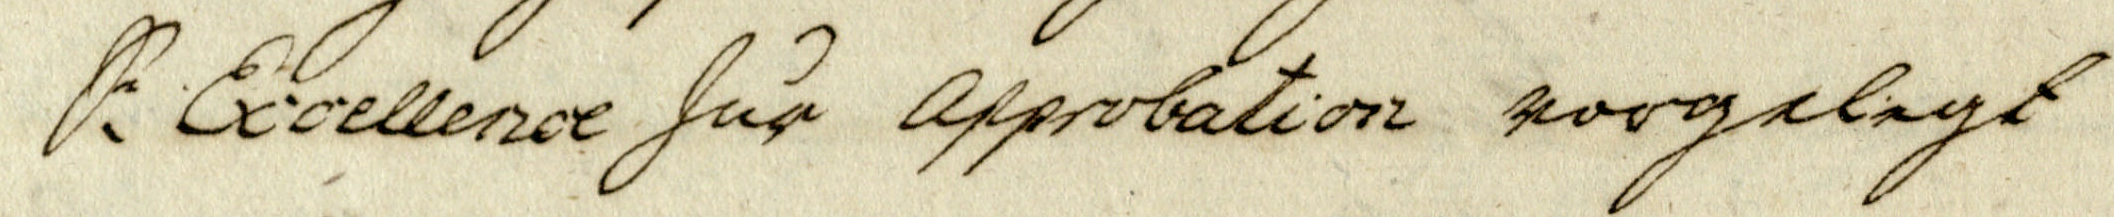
Sr. Excellence zur Approbation vorgelegt
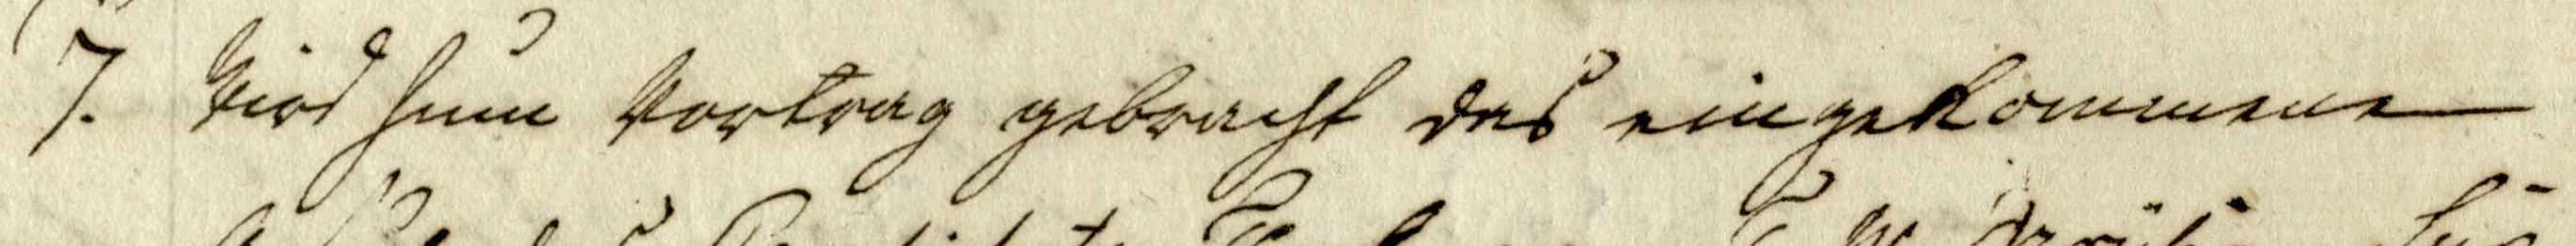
7. Wird zum Vortrag gebracht das eingekommene
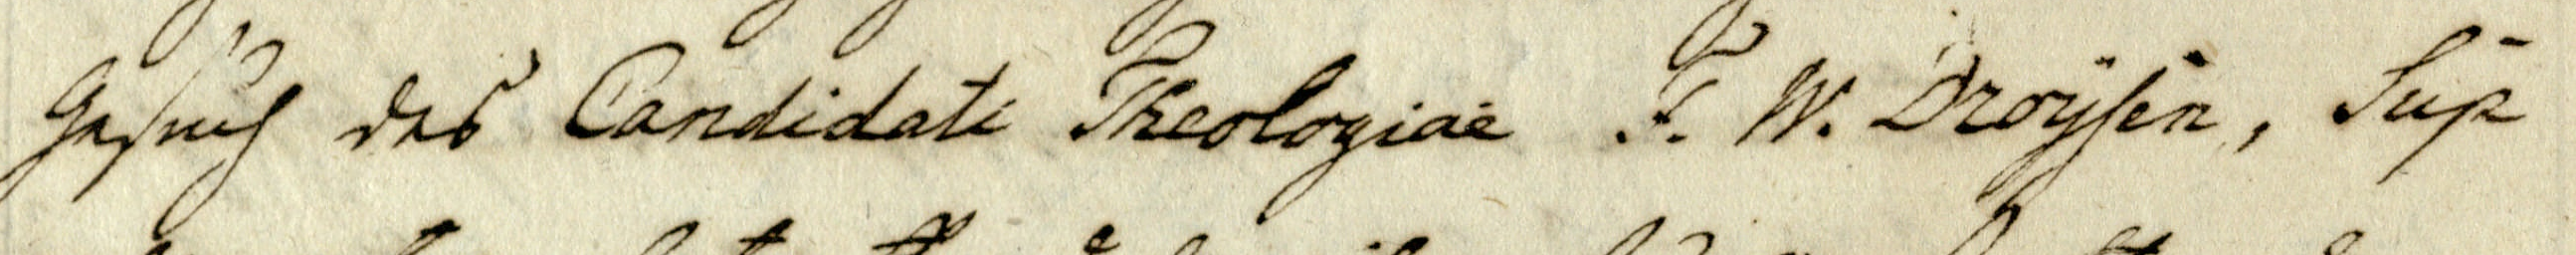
Gesuch des Candidati Theologiae F. W. Droÿsen, Sup¬
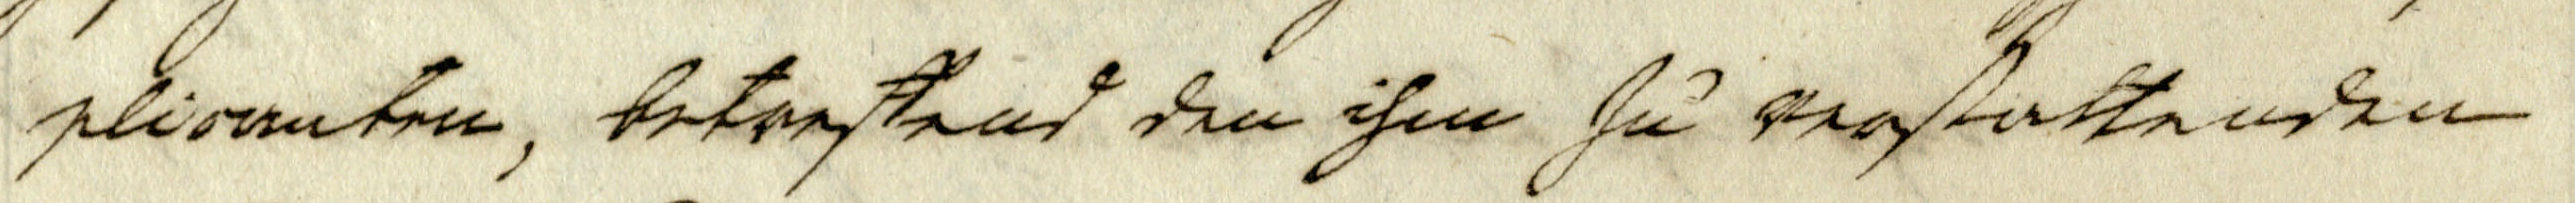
plicanten, betreffend den ihm zu verstattenden
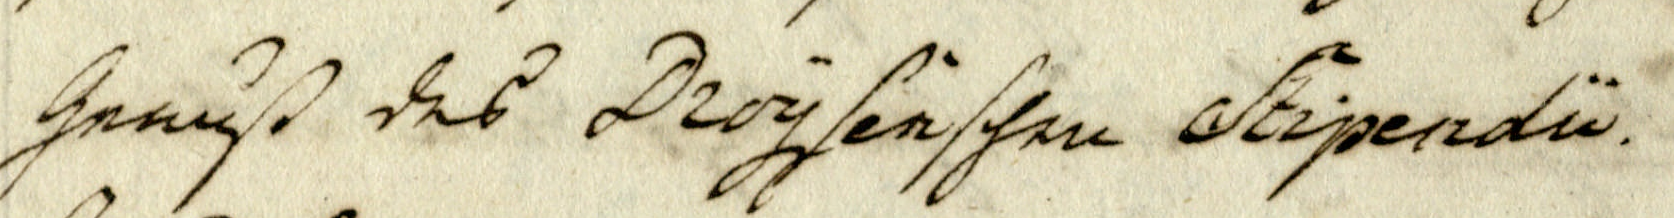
Genuß des Droÿsenschen Stipendii.
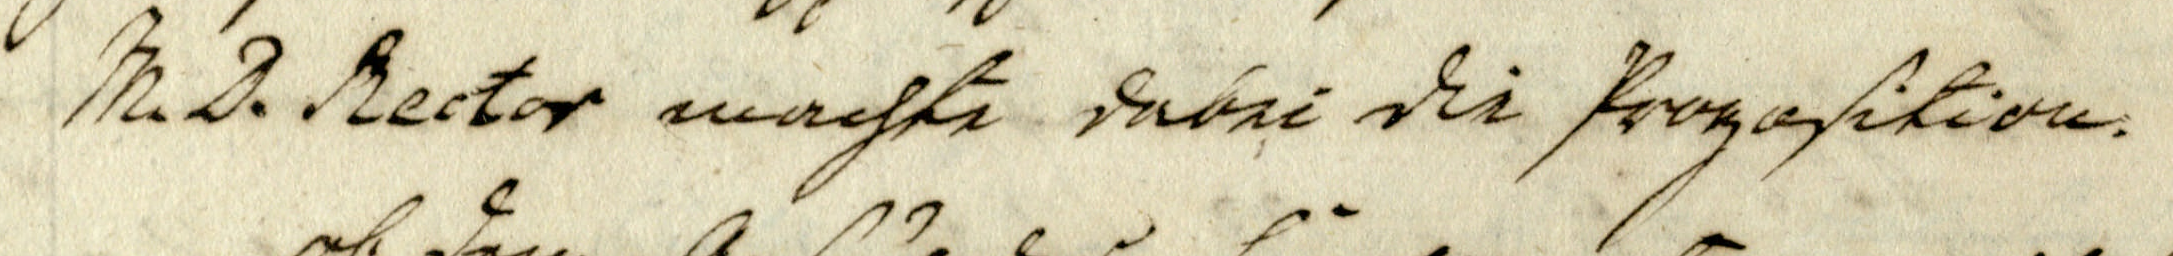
M. D. Rector machte dabei die Proposition:
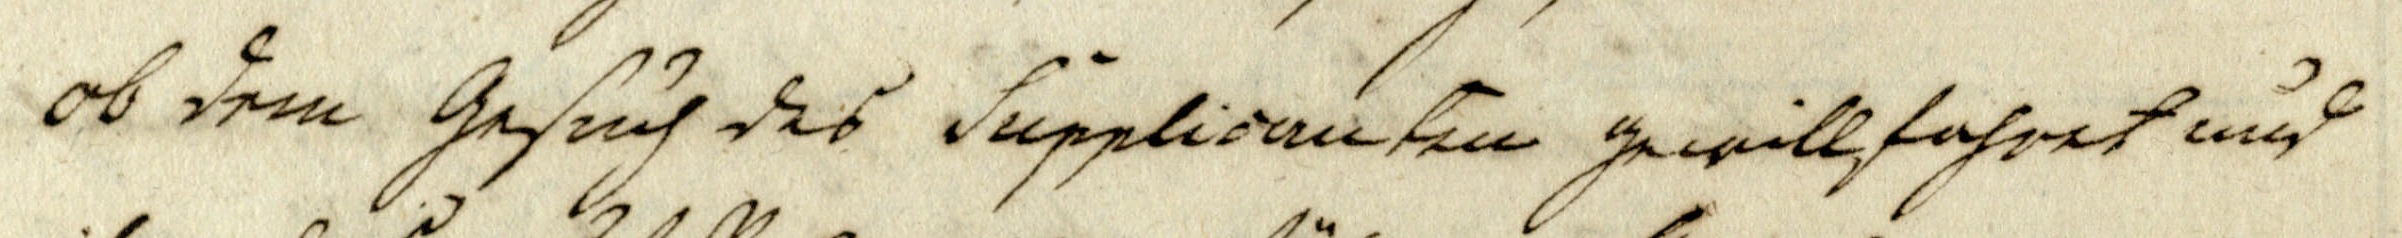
ob dem Gesuch des Supplicanten gewillfahret und
